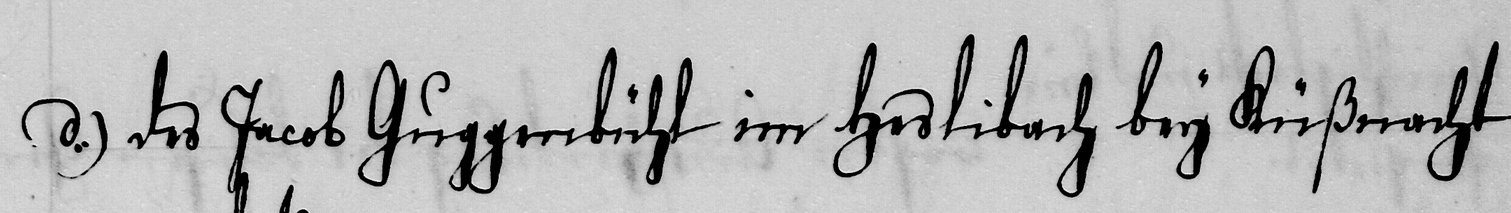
d.) des Jacob Guggenbühl im Heslibach bey Küßnacht
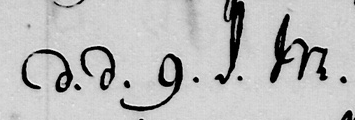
d. d. 9. d. M.
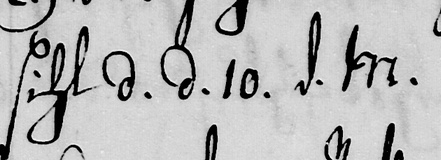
sihl d. d. 10. d. M.
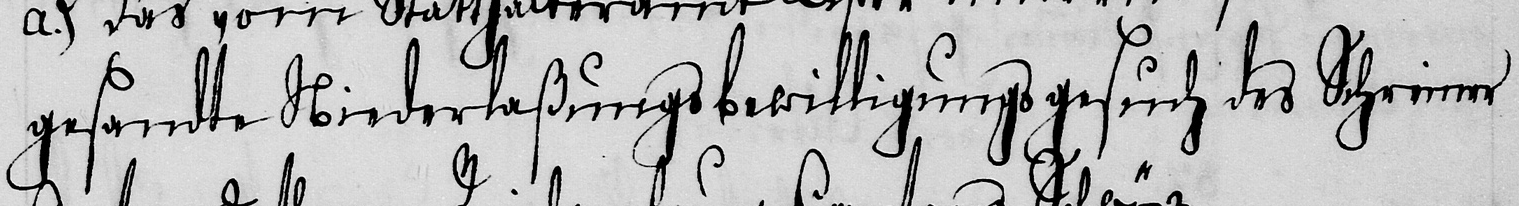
gesandte Niederlaßungsbewilligungsgesuch des Schreiner
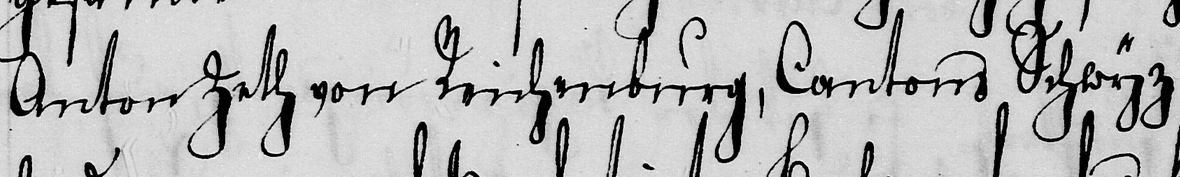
Anton Zeth von Reichenburg, Cantons Schwyz.
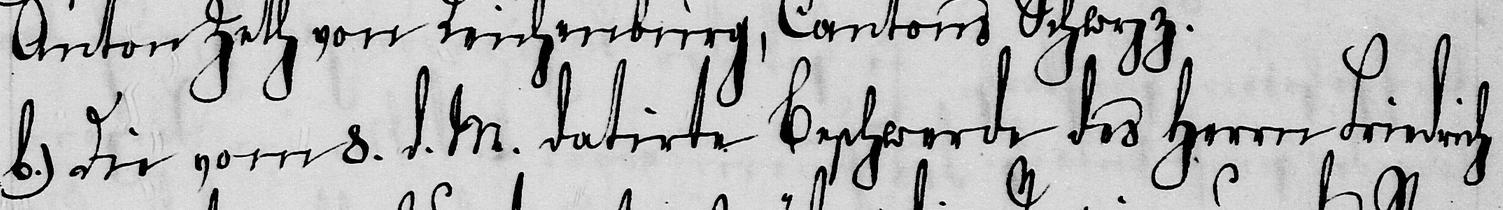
b.) Die vom 8. d. M. datirte Beschwerde des Herrn Friedri¬
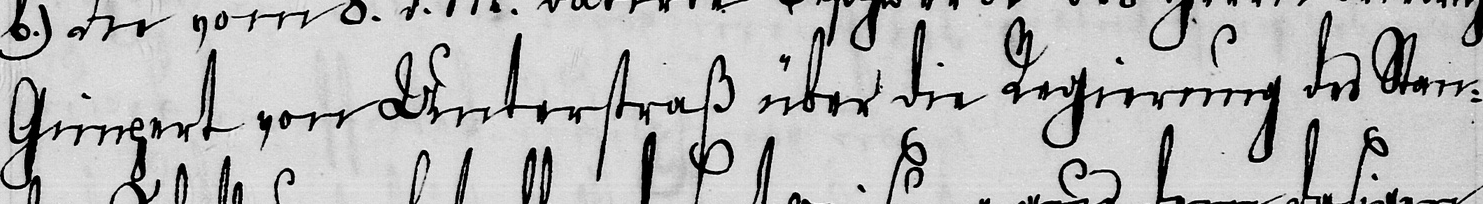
Gimpert von Unterstraß über die Regierung des Stan¬
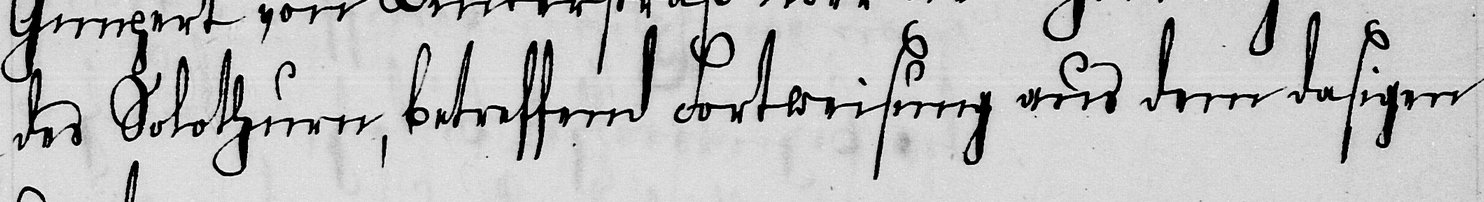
des Solothurn, betreffend Fortweisung aus dem dasigen
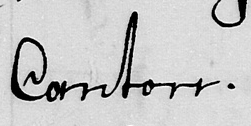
Canton.
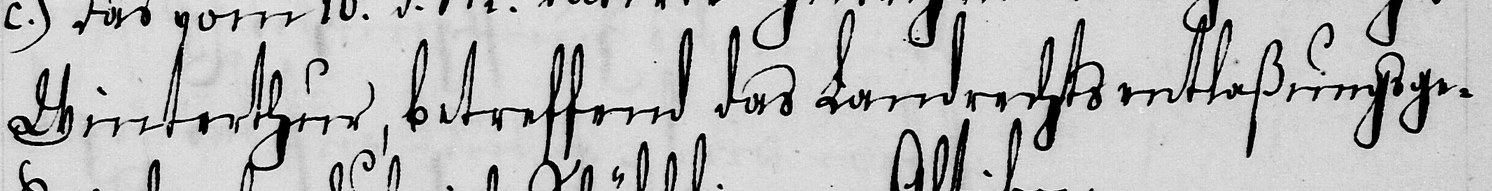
Winterthur, betreffend das Landrechtsentlaßungsge¬
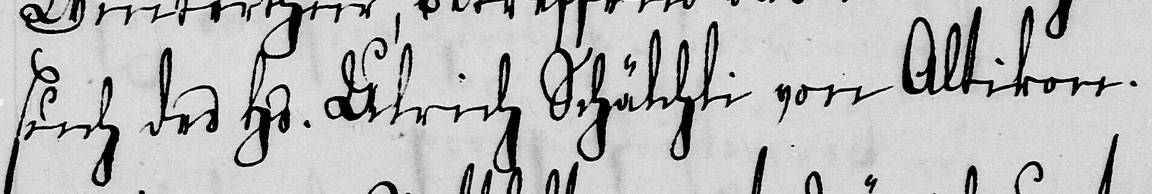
such des Hs. Ulrich Schälchli von Altikon.
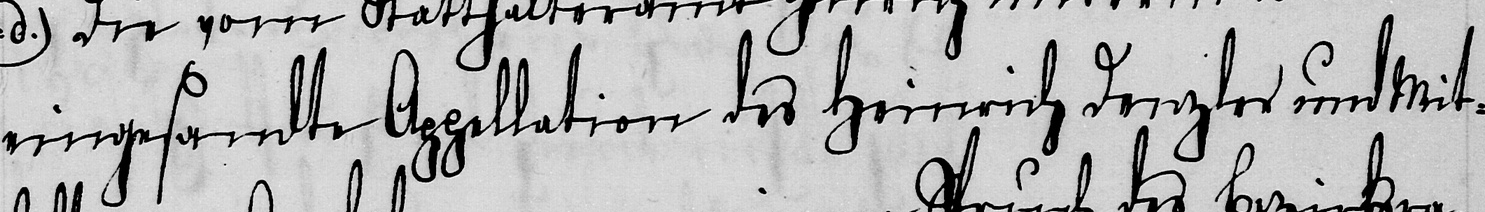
ingesandte Appellation des Heinrich Denzler und Mit¬
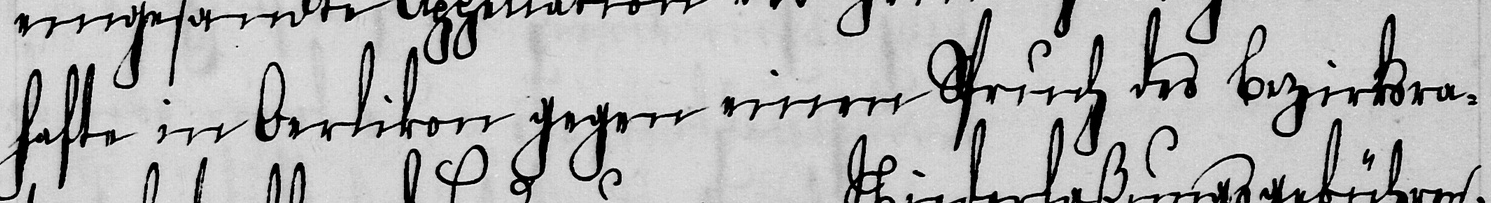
hafte in Oerlikon gegen einen Spruch des Bezirksra¬
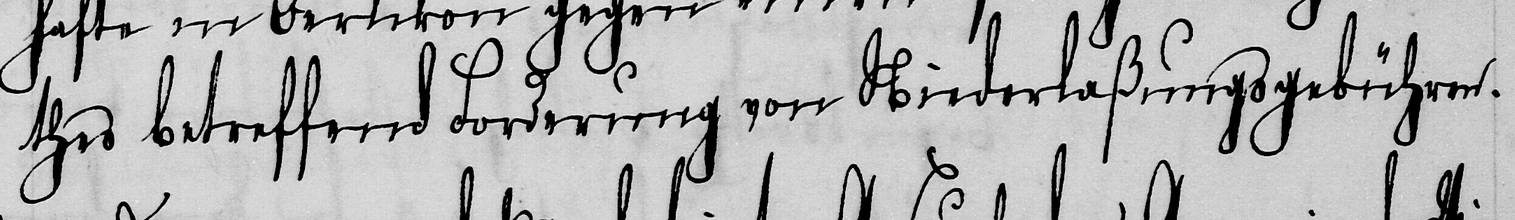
thes betreffend Forderung von Niederlaßungsgebühren.
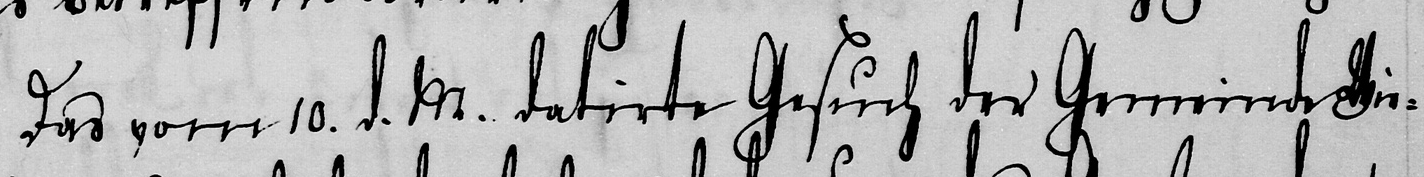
Das vom 10. d. M. datirte Gesuch der Gemeinde Wie¬
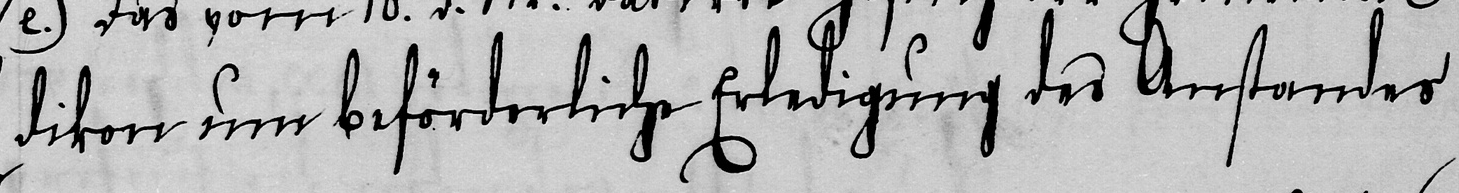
dikon um beförderliche Erledigung des Anstandes
